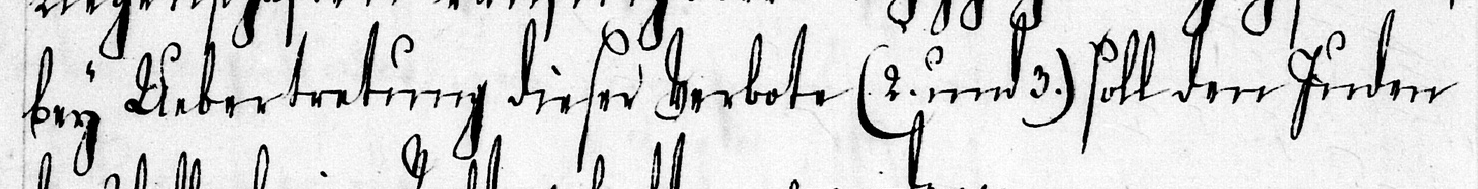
bey Uebertretung dieser Verbote (2. und 3.) soll den
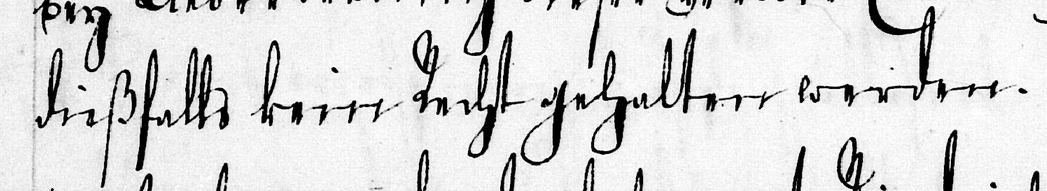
dießfalls kein Recht gehalten werden.
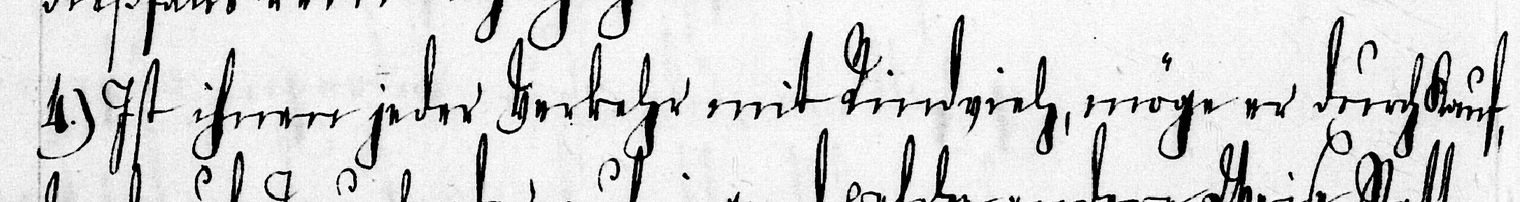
4.) Ist ihnen jeder Verkehr mit Rindvieh, möge er durch Kau¬
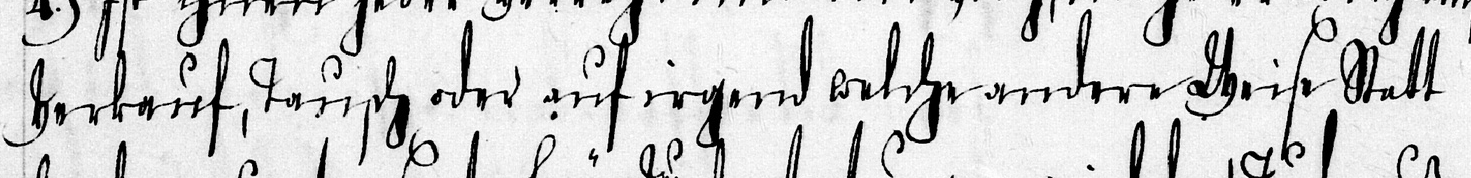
Verkauf, Tausch oder auf irgend welche andere Weise Statt
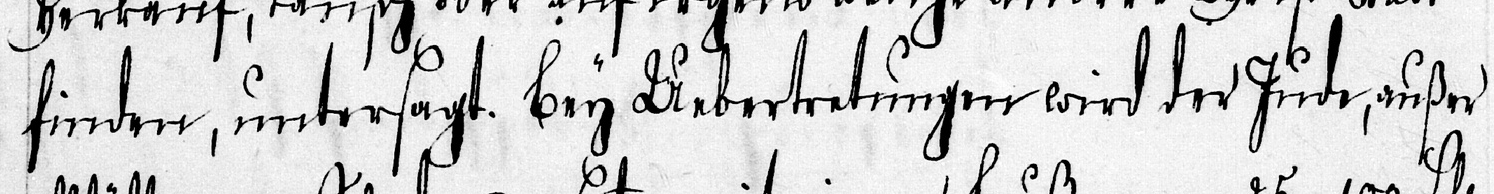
finden, untersagt. Bey Uebertretungen wird der Jude, außer
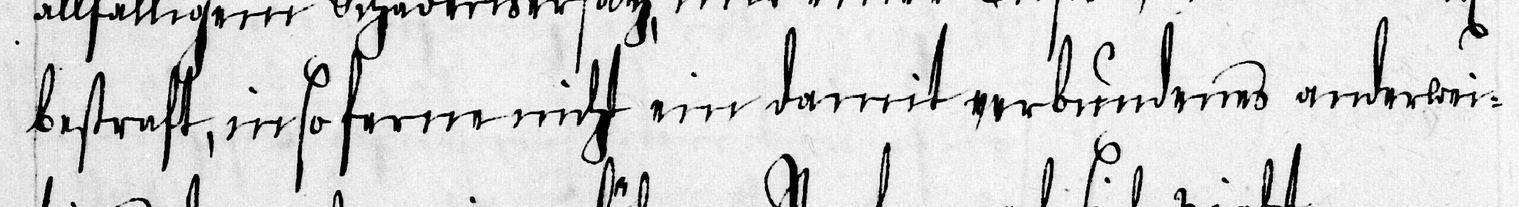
bestraft, insoferne nicht ein damit verbundenes anderwei¬
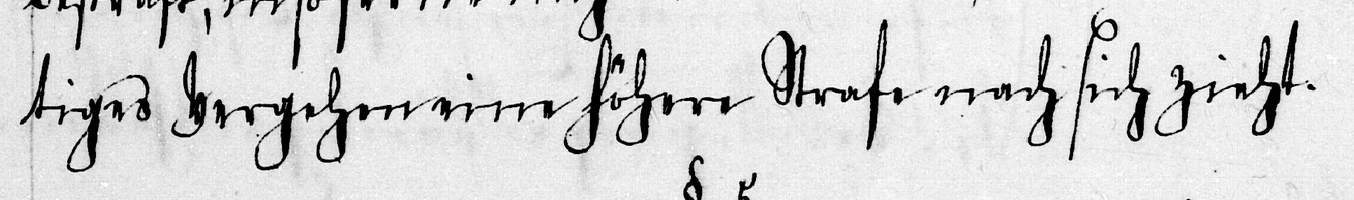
tiges Vergehen eine höhere Strafe nach sich zieht.
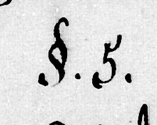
§. 5.
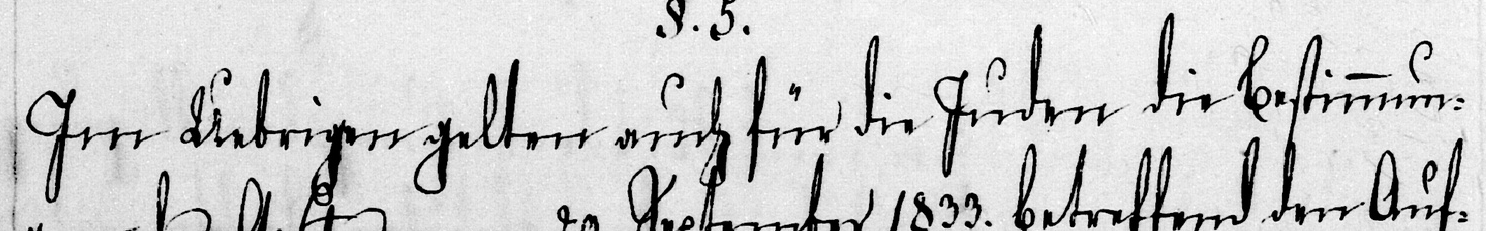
Im Uebrigen gelten auch für die Juden die Bestimmun¬
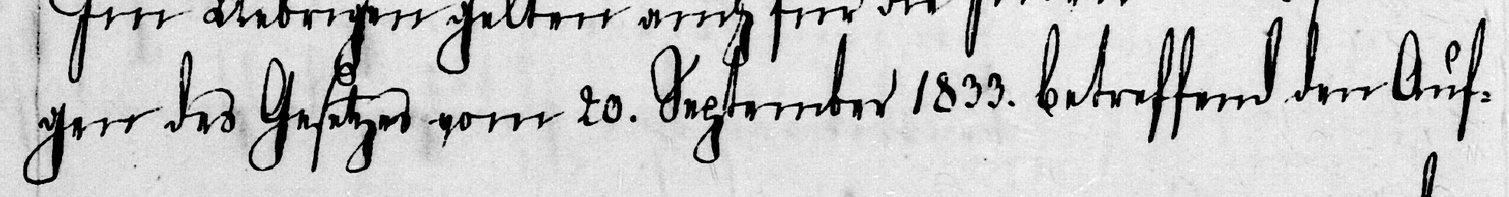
gen des Gesetzes vom 20. September 1833. betreffend den Auf-
